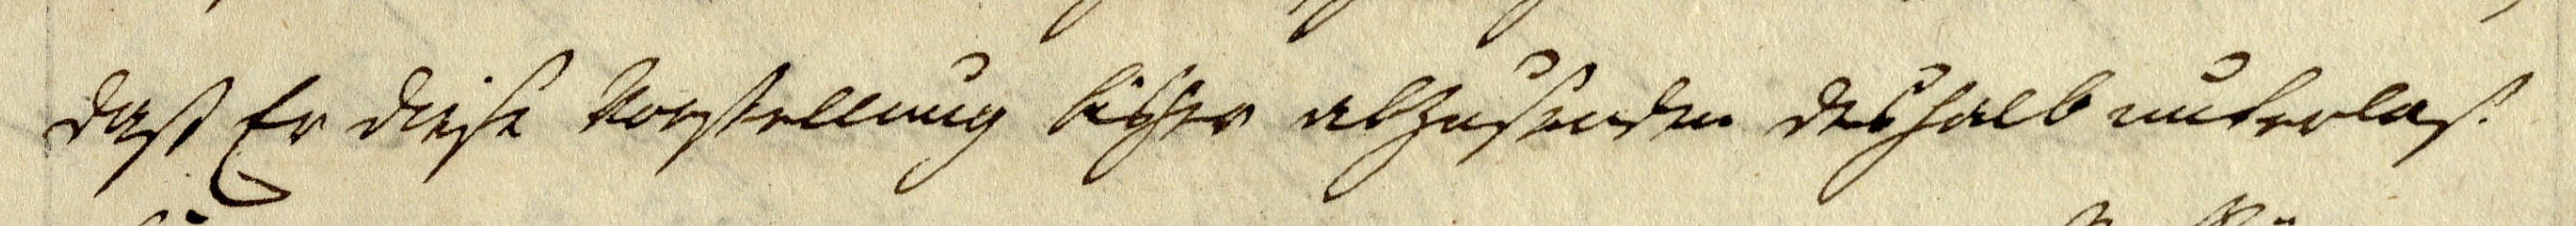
daß Er diese Vorstellung bisher abzusenden deshalb unterlas¬
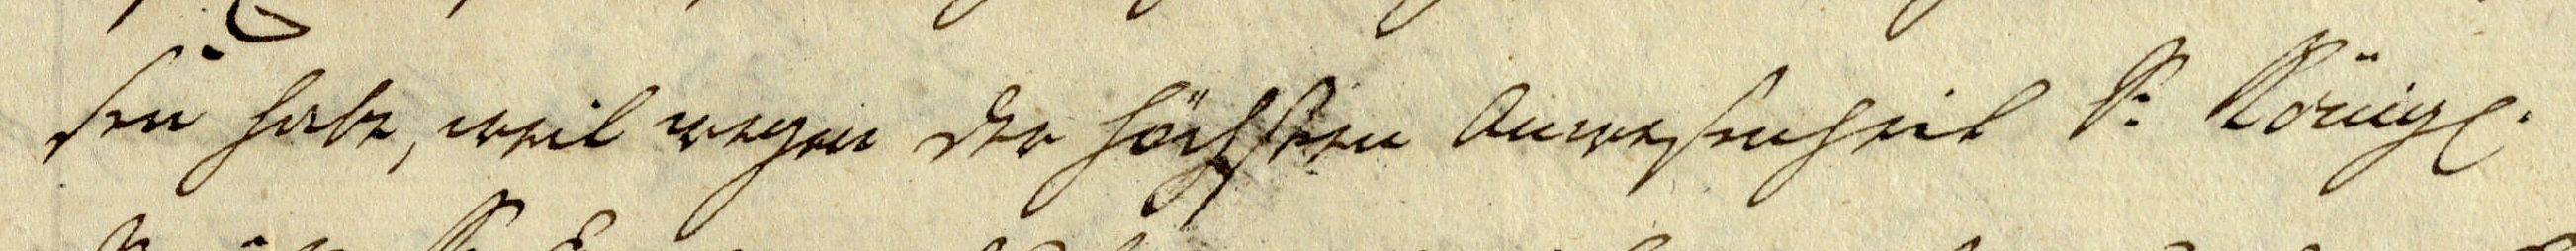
sen habe, weil wegen der höchsten Anwesenheit Sr Königl.
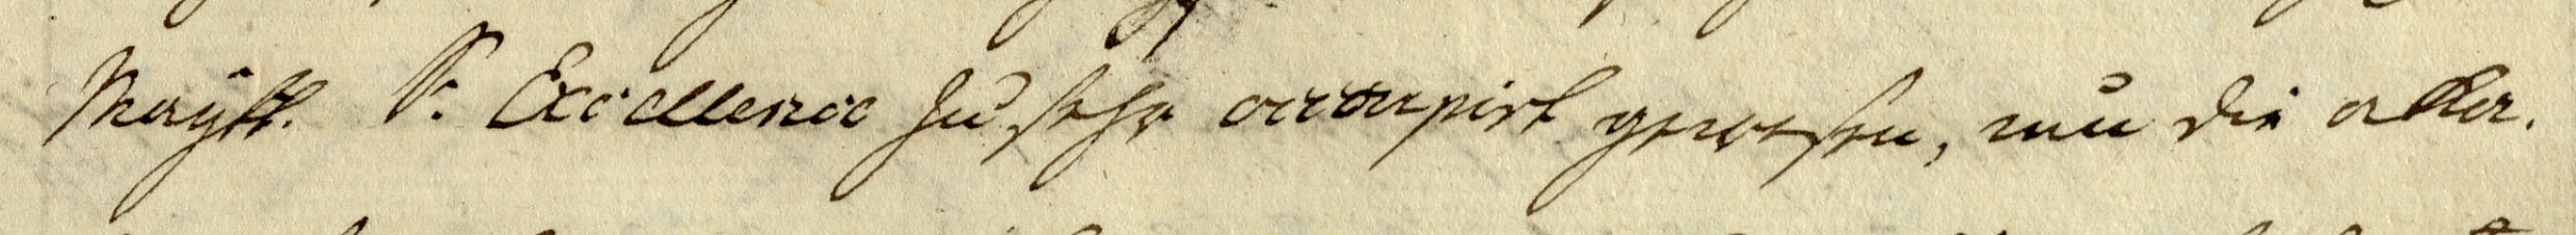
Maÿtt. Sr Excellence zu sehr occupirt gewesen, zum die aka¬
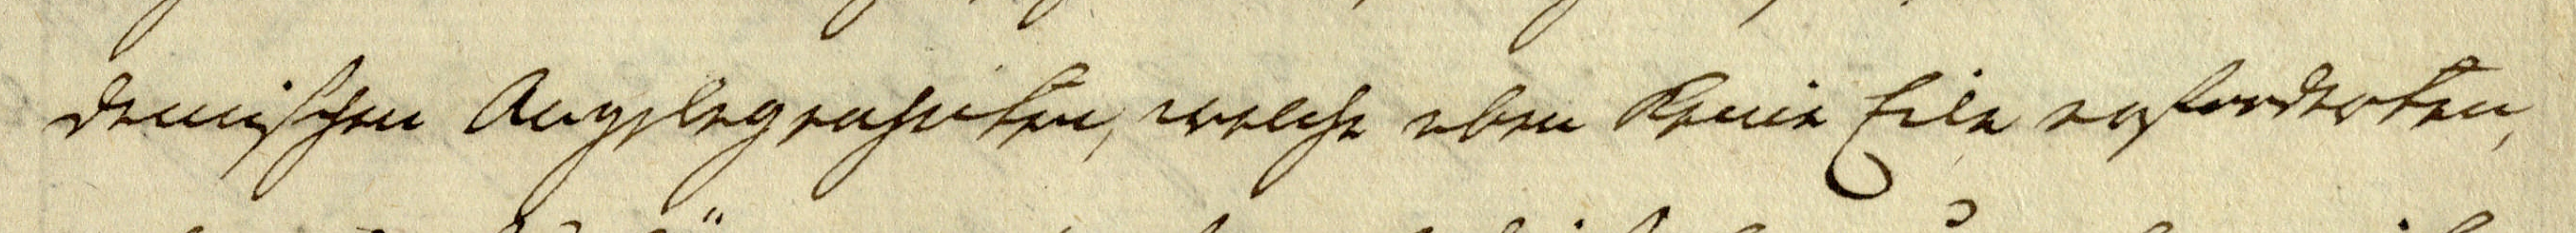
demischen Angelegenheiten, welche eben keine Eile erforderten,
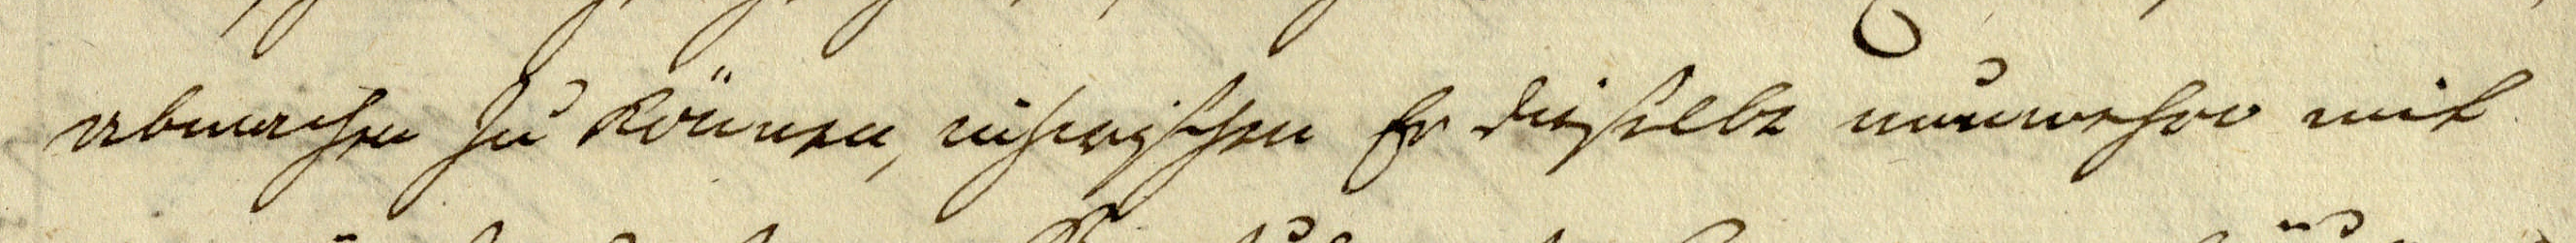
abmachen zu können, inzwischen Er dieselbe nunmehro mit
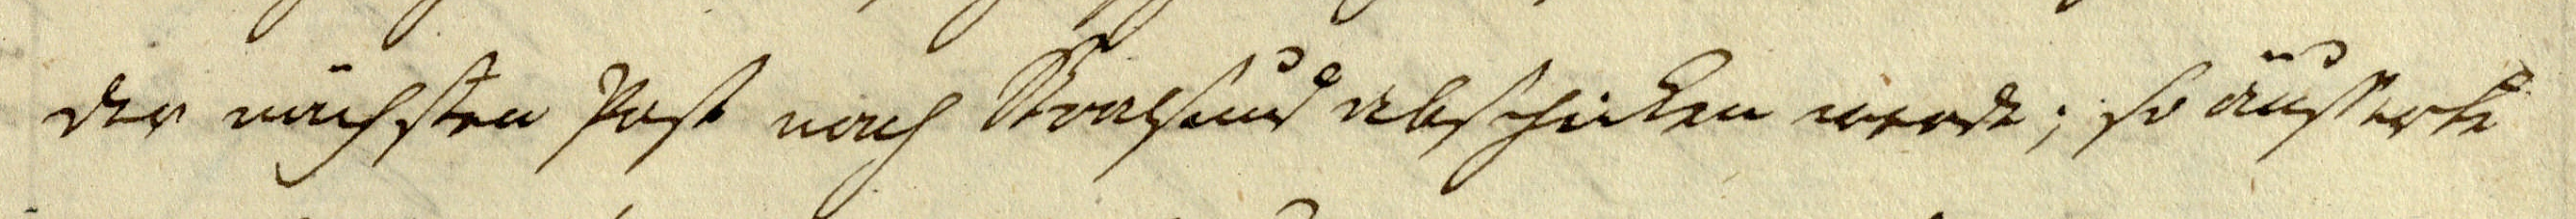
der nächsten Post nach Stralsund abschicken werde; so äusserte
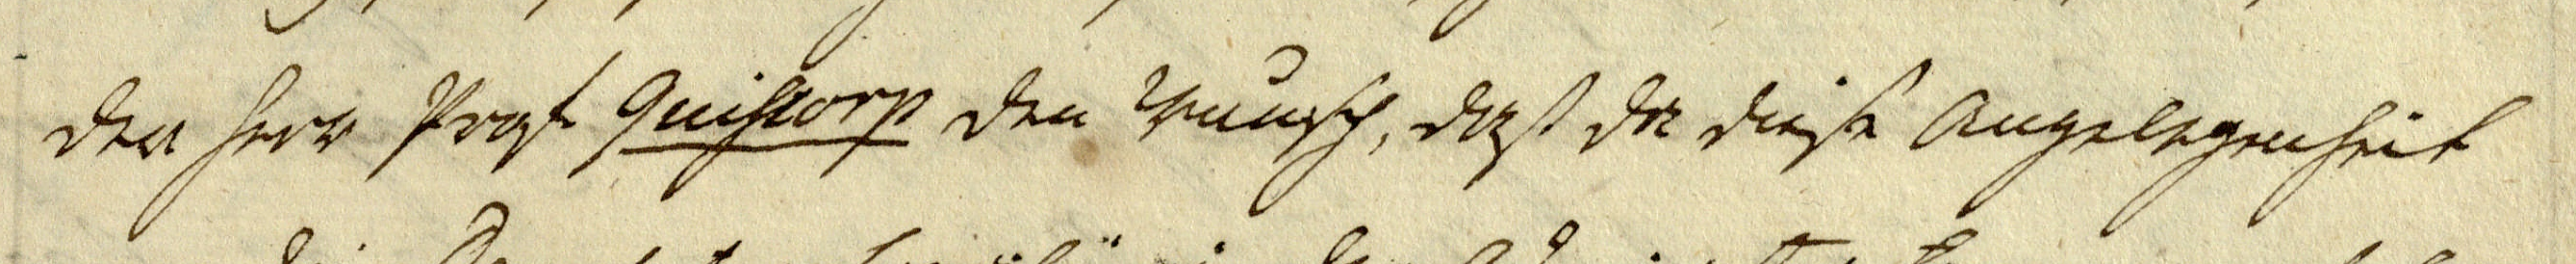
der Herr Prof. Quistorp den Wunsch, daß da diese Angelegenheit
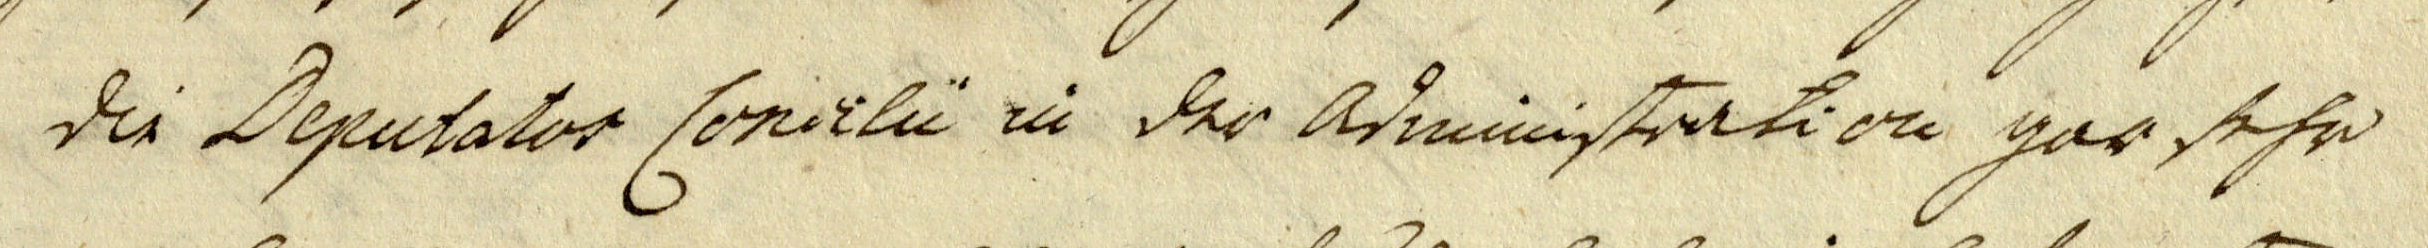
die Deputatos Concilii in der Administration gar sehr
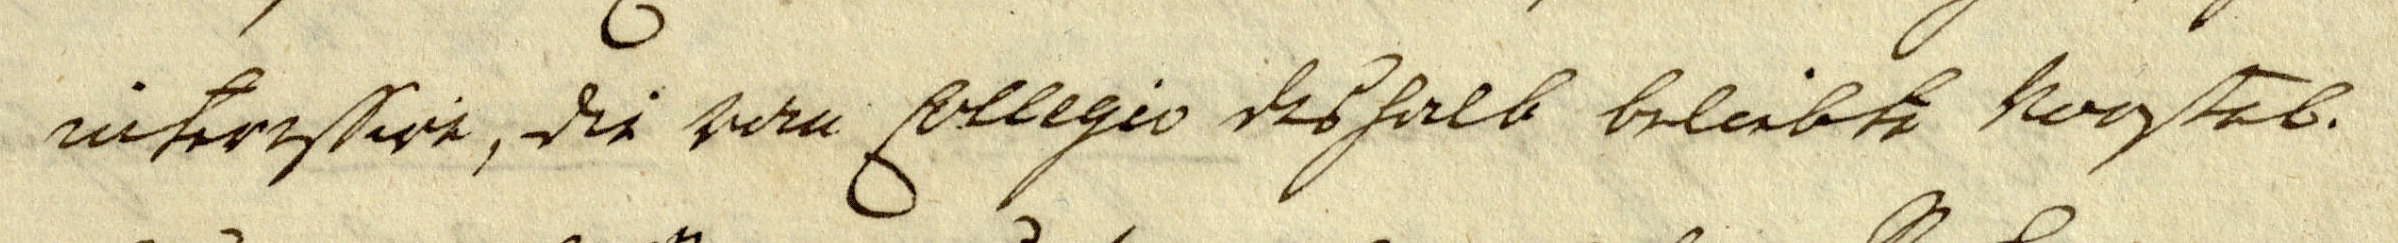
interessire, die vom Collegio deshalb beliebte Vorstel¬
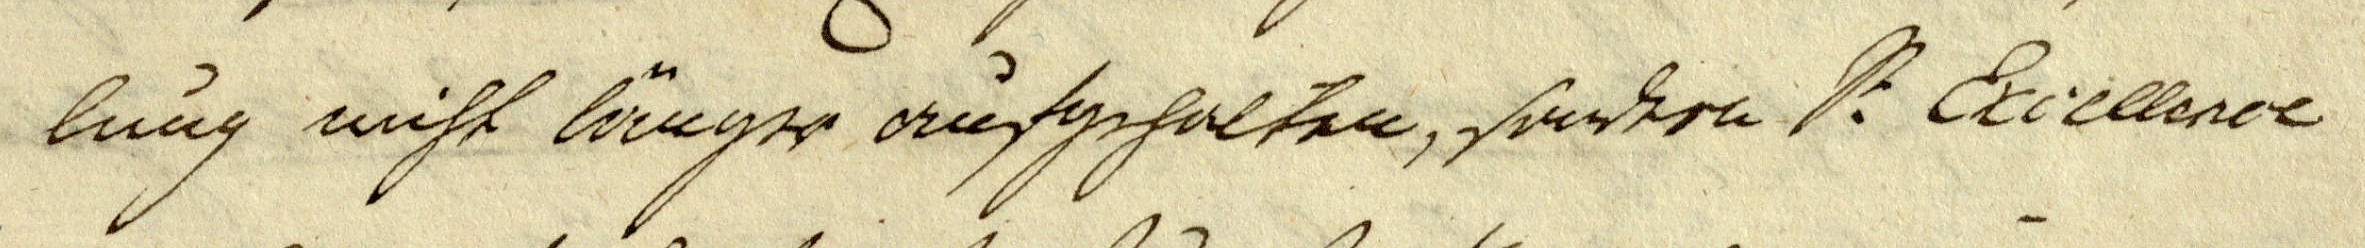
lung nicht länger aufgehalten, sondern Sr Excellence
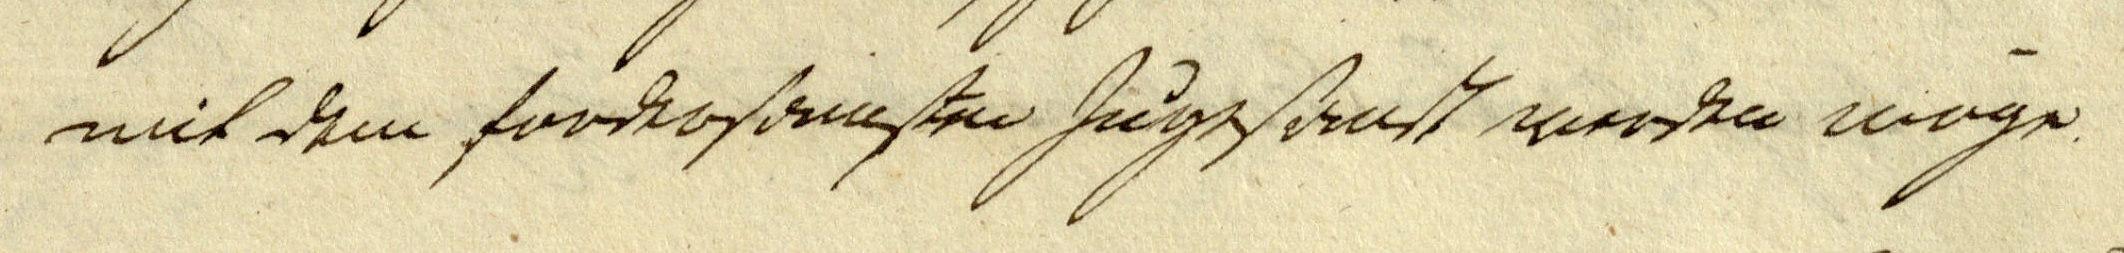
mit dem fordersamsten zugesandt werden möge.
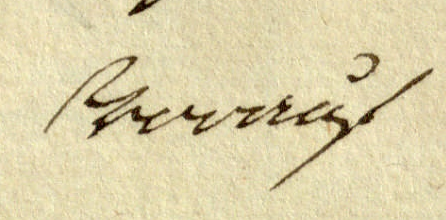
Worauf
